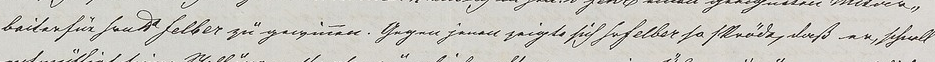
beiter für Hrn DrFelber zu gewinnen. Gegen jenen zeigte sich Hr Felber so spröde, daß er, schnell
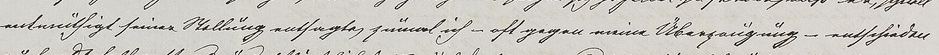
entmuthigt seiner Stellung entsagte, zumal ich – oft gegen meine Überzeugung – entschieden
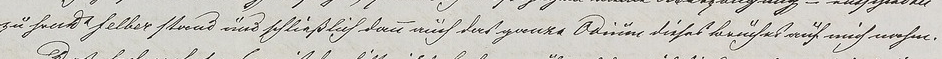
zu Hrn DrFelber stand und schließlich dann auch das ganze Odium dieses Bruches auf mich nahm.
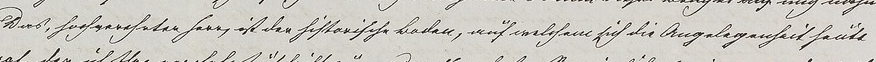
Das, hochverehrter Herr, ist der historische Boden, auf welchem sich die Angelegenheit heute
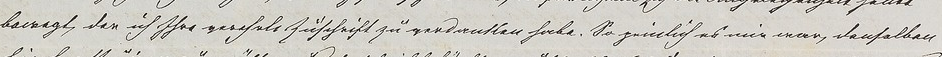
bewegt, der ich Ihre verehrte Zuschrift zu verdanken habe. So peinlich es mir war, denselben
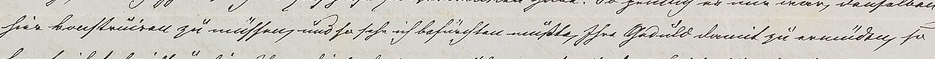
hier konstruiren zu müssen, und so sehr ich befürchten mußte, Ihre Geduld damit zu ermüden, so
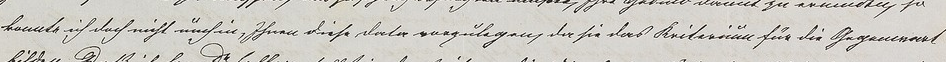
konnte ich doch nicht umhin, Ihnen diese data vorzulegen, da sie das Kriterium für die Gegenwart
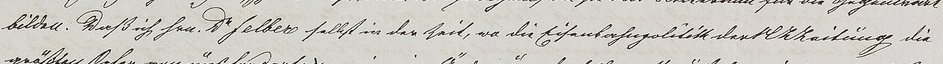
bilden. Daß ich Hrn. DrFelber selbst in der Zeit, wo die Eisenbahnpolitik der NZZeitung die
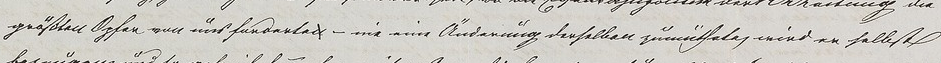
größten Opfer von uns forderten – nie eine Änderung derselben zumuthete, wird er selbst
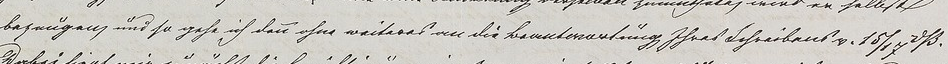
bezeugen, und so gehe ich denn ohne weiteres an die Beantwortung Ihres Schreibens v. 15/ 17 dß.
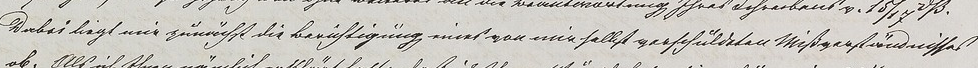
Dabei liegt mir zunächst die Berichtigung eines von mir selbst verschuldeten Mißverständnisses
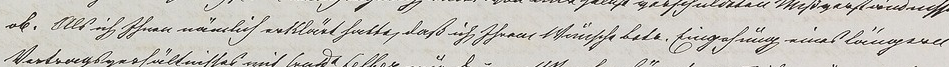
ob. Als ich Ihnen nämlich erklärt hatte, daß ich Ihrem Wunsche betr. Eingehung eines längern
